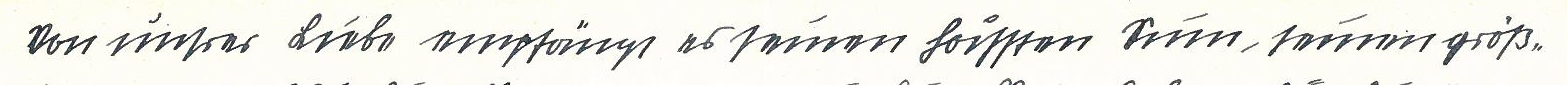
Von unsrer Liebe empfängt es seinen höchsten Sinn, seinen größ¬
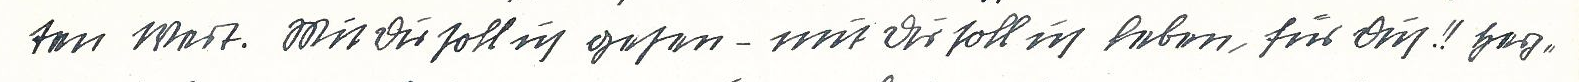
ten Wert. Mit Dir soll ich gehen – mit Dir soll ich leben, für Dich!! Herz¬
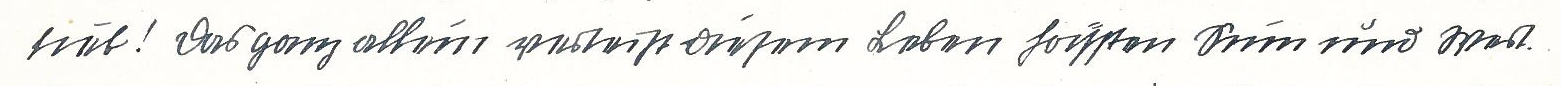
lieb! Das ganz allein verleiht diesem Leben höchsten Sinn und Wert.
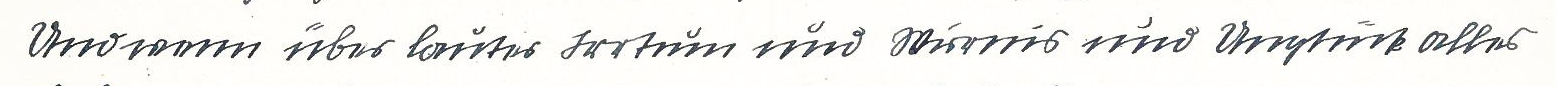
Und wenn über lauter Irrtum und Wirrnis und Unglück alles
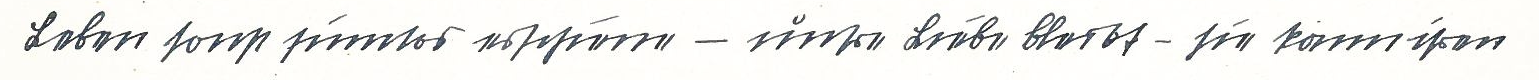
Leben sonst sinnlos erschiene – unsre Liebe bleibt – sie kann ihren
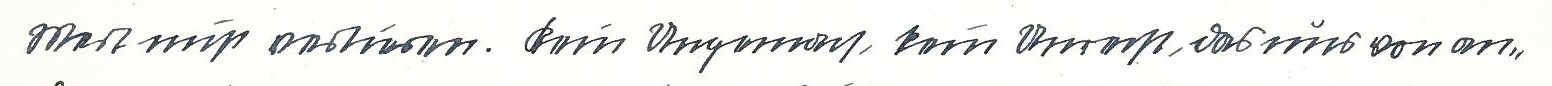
Wert nicht verlieren. Kein Ungemach, kein Unrecht, das uns von an¬
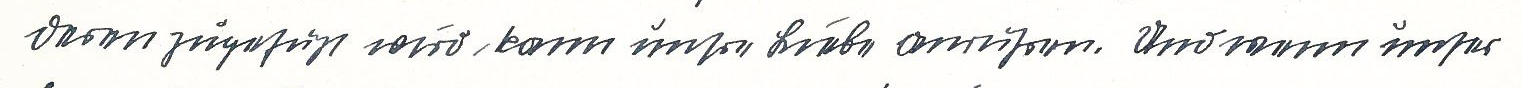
deren zugefügt wird, kann unsre Liebe anrühren. Und wenn unser
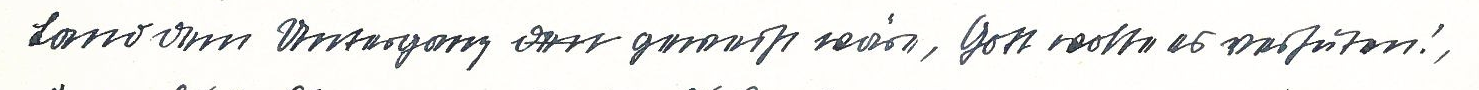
Land dem Untergang geweiht wäre, Gott wolle es verhüten!,
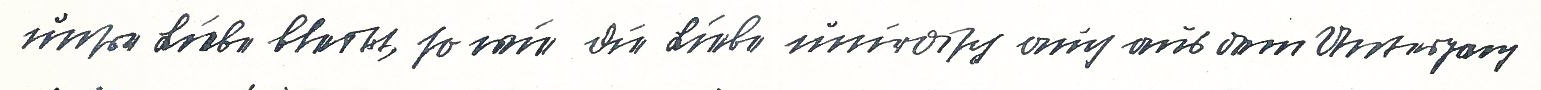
unsre Liebe bleibt, so wie die Liebe unirdisch auch aus dem Untergang
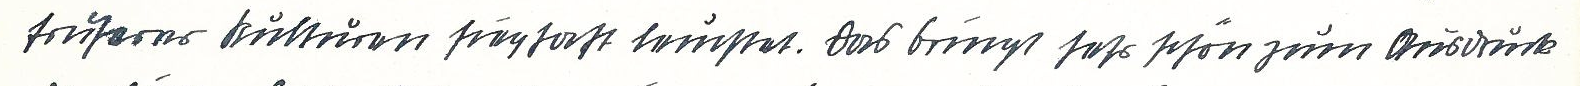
früherer Kulturen sieghaft leuchtet. Das bringt sehr schön zu Ausdruck
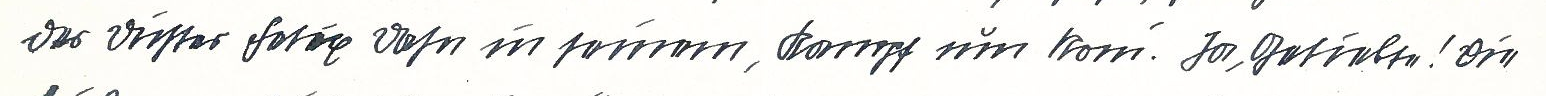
der Dichter Felix Dahn in seinem ,Kampf um Rom’. Ja, Geliebte! Die
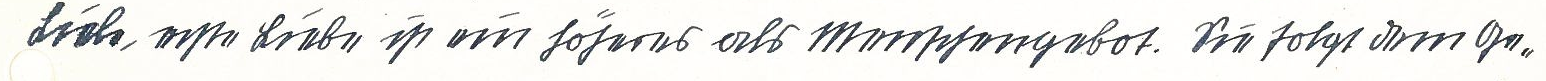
Liebe, echte Liebe ist ein höheres als Menschengebot. Sie folgt dem Ge¬
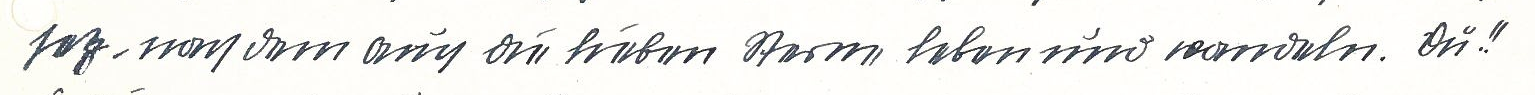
setz, nach dem auch die lieben Sterne leben und wandeln. Du!!
